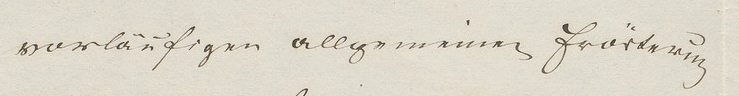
vorlaufigen allgemeinen Erörterung
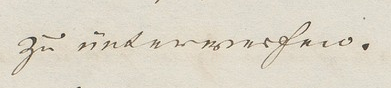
zu unterwerfen.
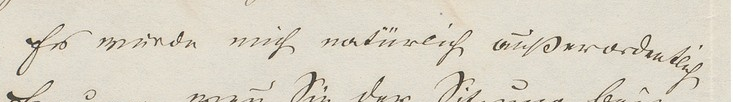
Er würde mich natürlich außerordentlich
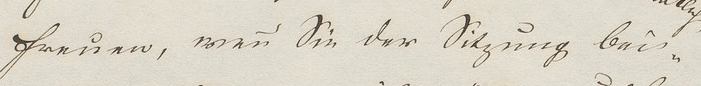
freuen, wenn Sie der Sitzung bei-
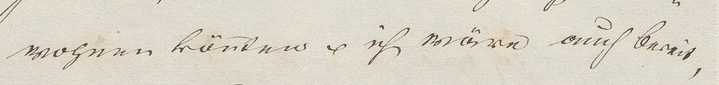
wohnen könnten & ich wäre auch bereit,
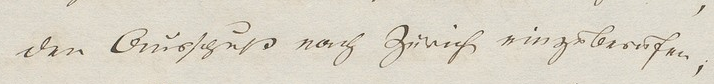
den Ausschuß nach Zürich einzuberufen,
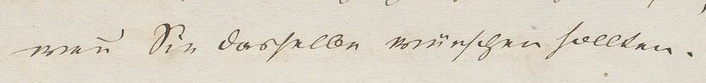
wenn Sie dasselben wünschen sollten.
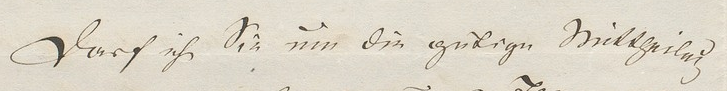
Darf ich Sie um die gütige Mittheilung
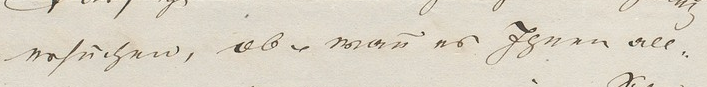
ersuchen, ob & wann es Ihnen all-
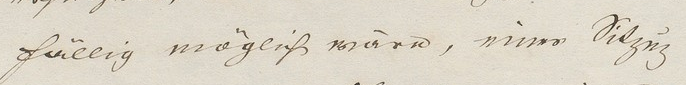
fällig möglich wäre, einer Sitzung
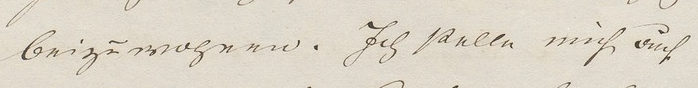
beizuwohnen. Ich stelle mich auf
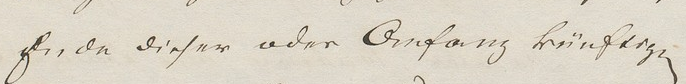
Ende dieser oder Anfang künftiger
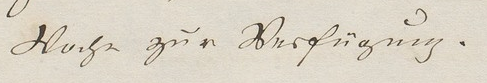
Woche zur Verfügung.
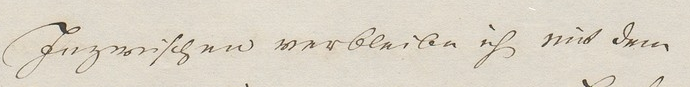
Inzwischen verbleibe ich mit dem
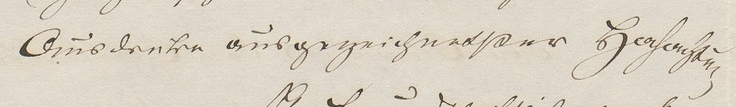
Ausdruke ausgezeichnetster Hochachtung
